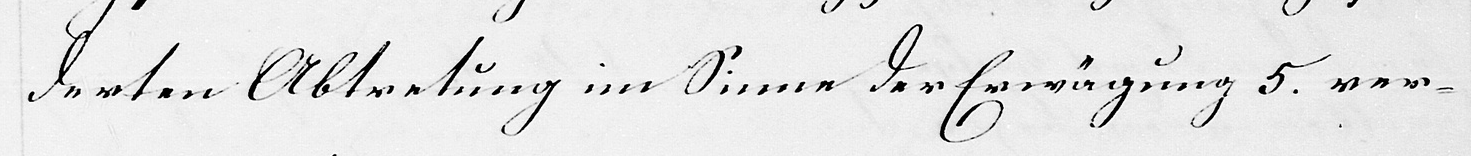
derten Abtretung im Sinne der Erwägung 5. ver¬
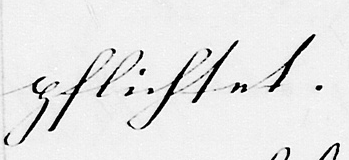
pflichtet.
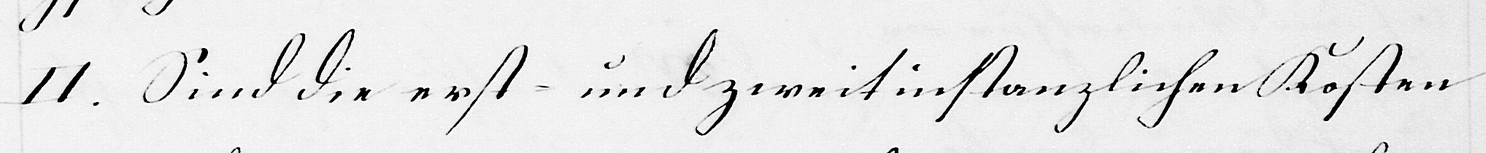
II. Sind die erst- und zweitinstanzlichen Kosten
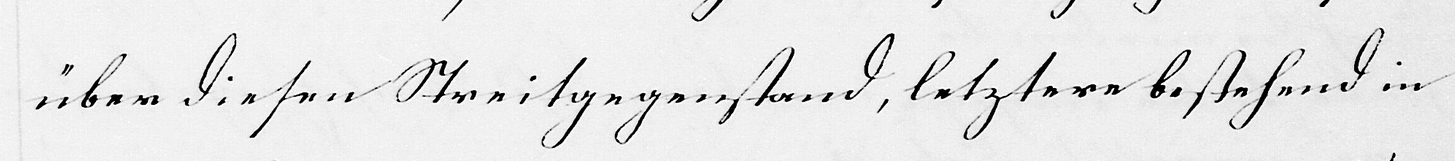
über diesen Streitgegenstand, letztere bestehend in
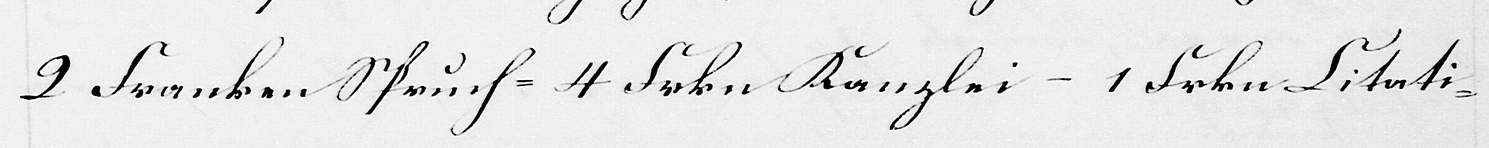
2 Franken Spruch- 4 Frkn Kanzlei- 1 Frkn Citati¬
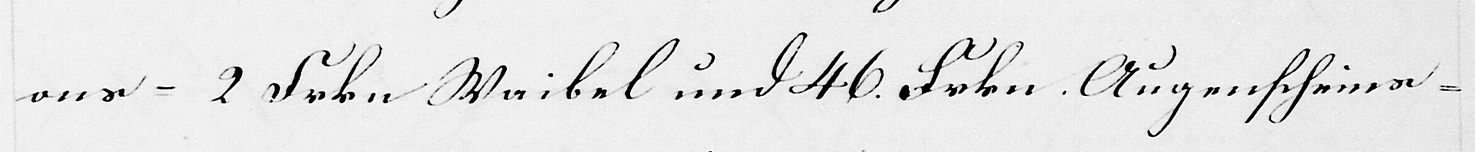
ons- 2 Frkn Waibel und 46. Frkn. Augenschein¬
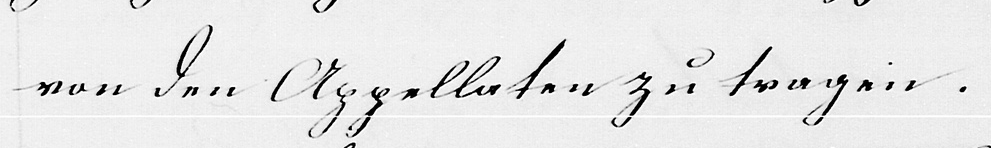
von den Appellaten zu tragen.
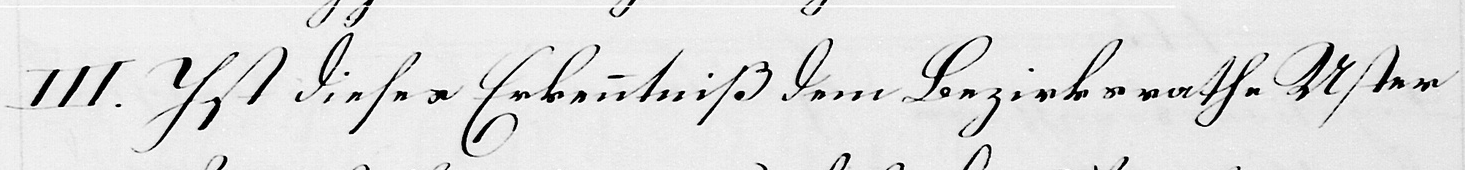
III. Ist dieses Erkenntniß dem Bezirksrathe Uster
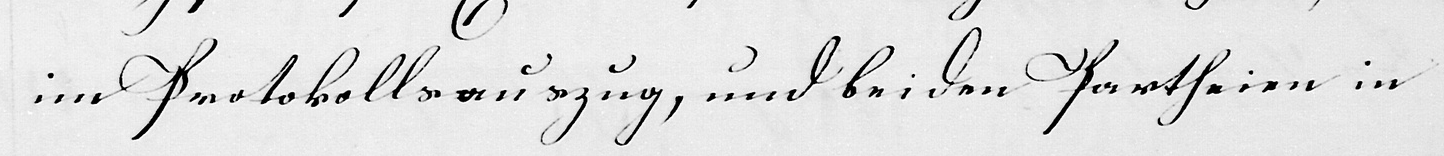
im Protokollsauszug, und beiden Partheien in
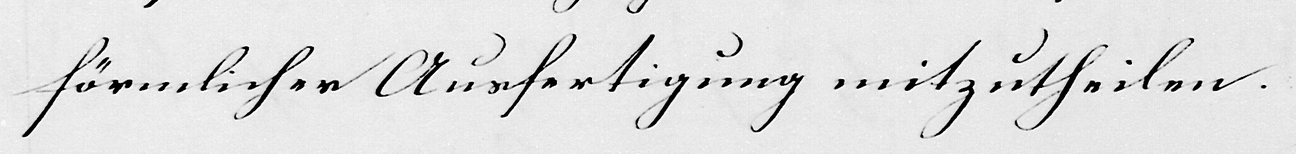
förmlicher Ausfertigung mitzutheilen.
